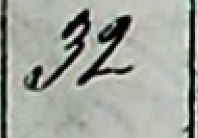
32
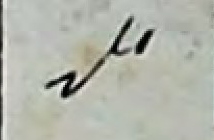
do
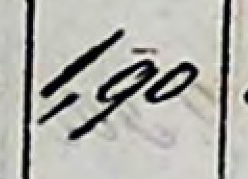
1,90
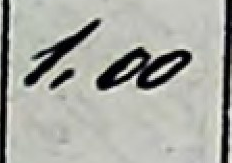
1,00
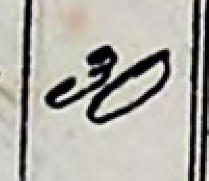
30
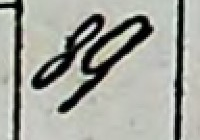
89
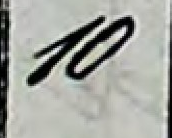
10
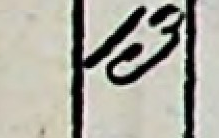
13
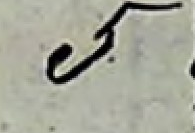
5
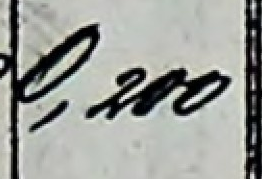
0,200
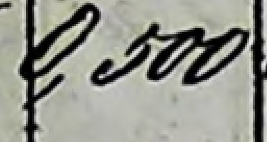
0,500
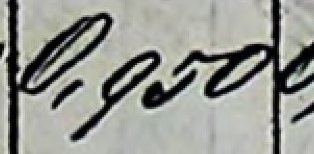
0,950
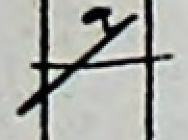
7
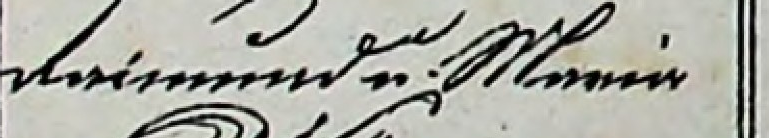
Daimund u. Maria
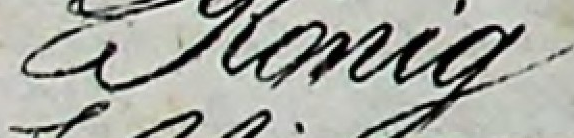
König
